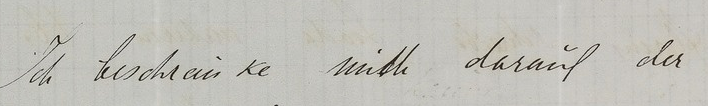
Ich beschränke mich darauf der
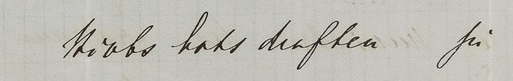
dieser Hiobsbotschaften zu sein
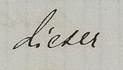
deren
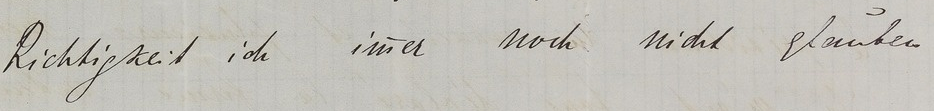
Richtigkeit ich immer noch nicht glauben
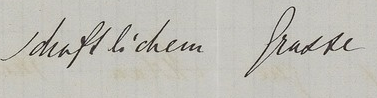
schaftlichem Grusse
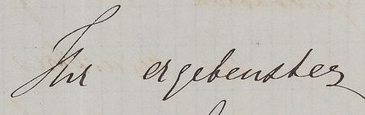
Ihr ergebenster
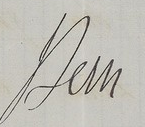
Bern
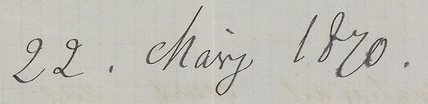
22. März 1870.
